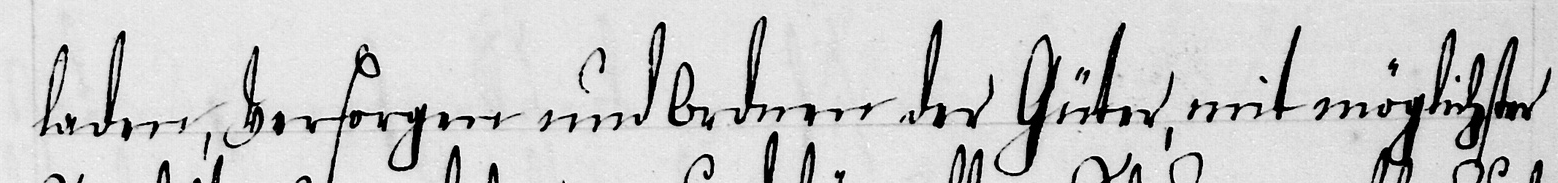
laden, Versorgen und Ordnen der Güter, mit möglichst¬
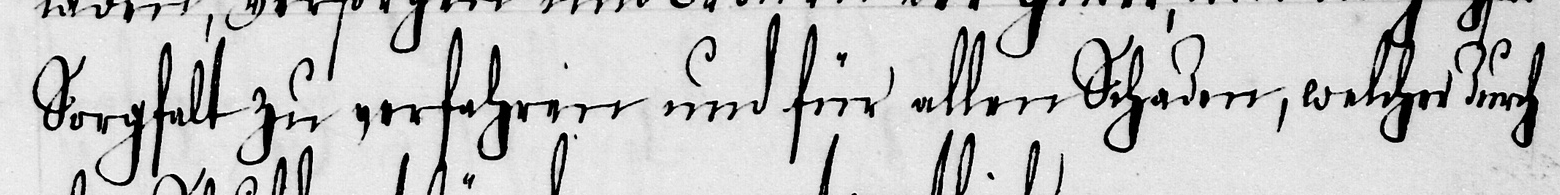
Sorgfalt zu verfahren und für allen Schaden, welcher dur¬
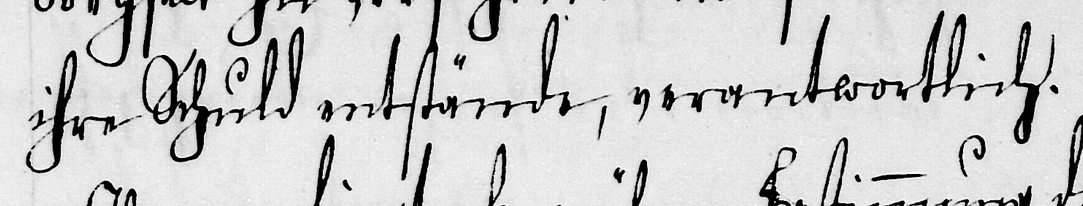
ihre Schuld entstände, verantwortlich.
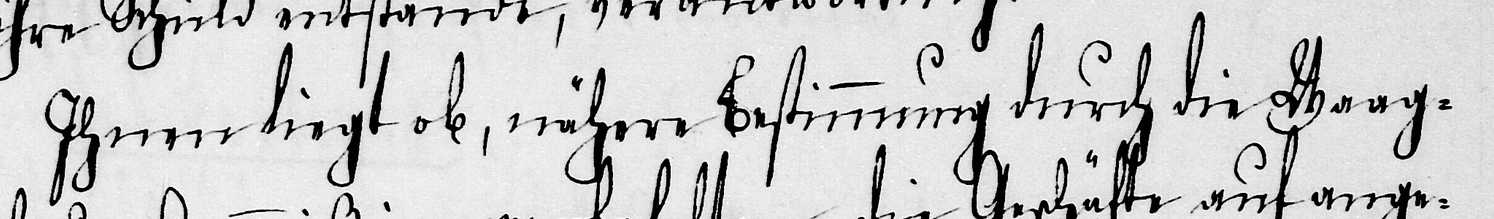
Ihnen liegt ob, nähere Bestimmung durch die Waag¬
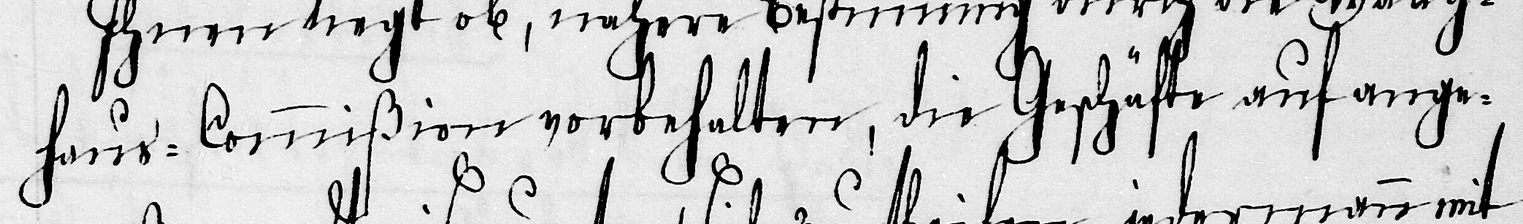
haus-Commißion vorbehalten, die Geschäfte auf ange¬
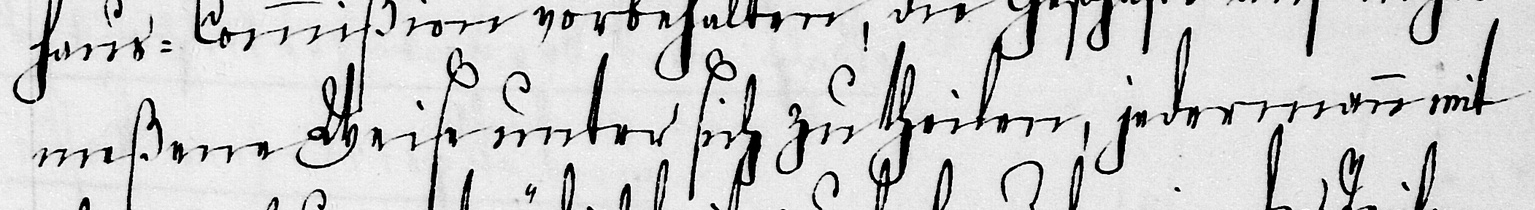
meßene Weise unter sich zu theilen, jedermann mit
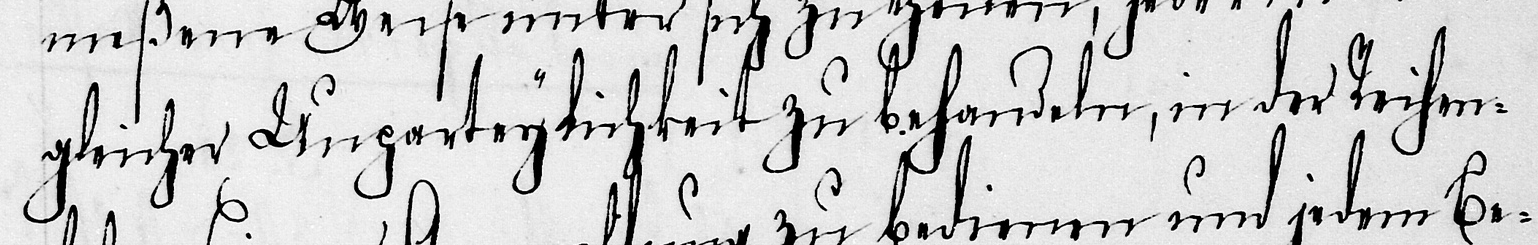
gleicher Unparteylichkeit zu behandeln, in der Reihen¬
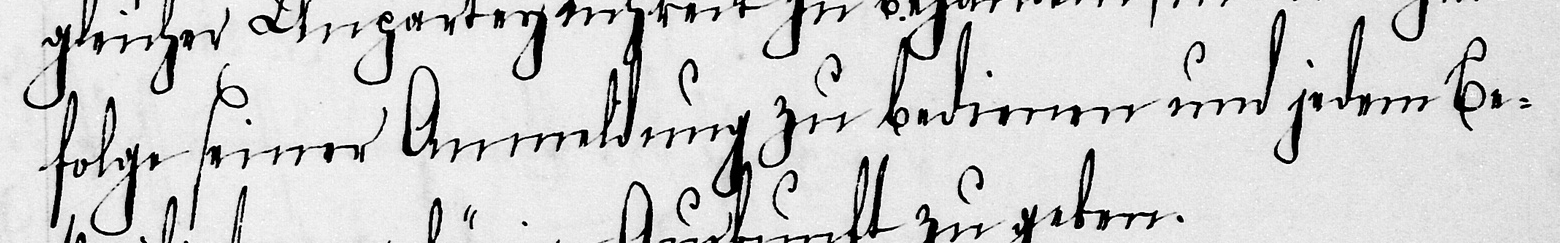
folge seiner Anmeldung zu bedienen und jedem Be¬
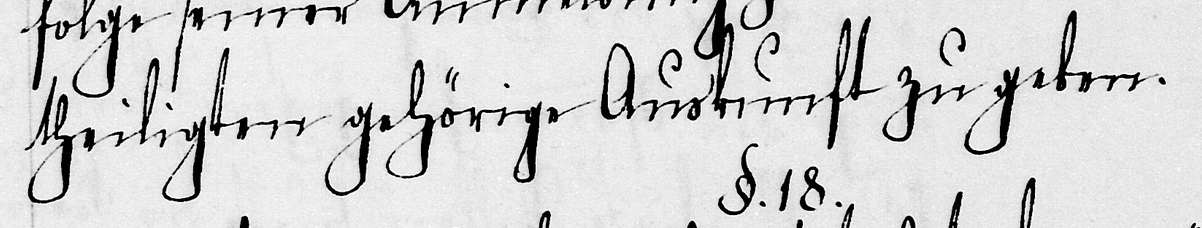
theiligten gehörige Auskunft zu geben.
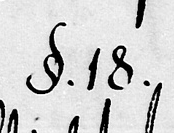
§. 18.
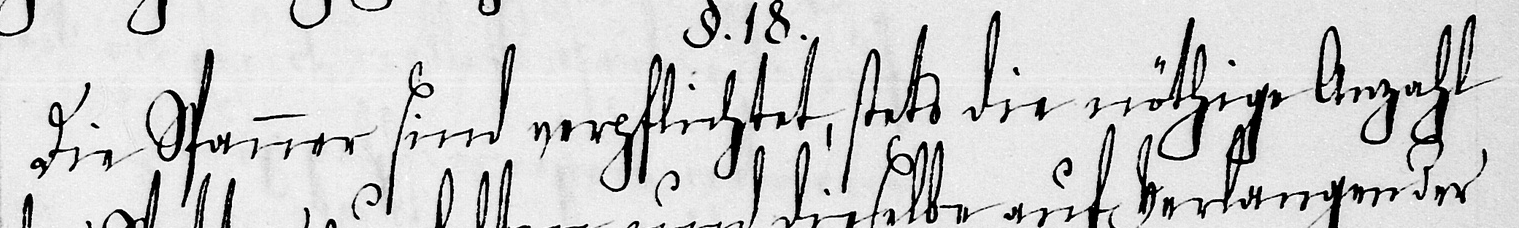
Die Spanner sind verpflichtet, stets die nöthige Anzahl
